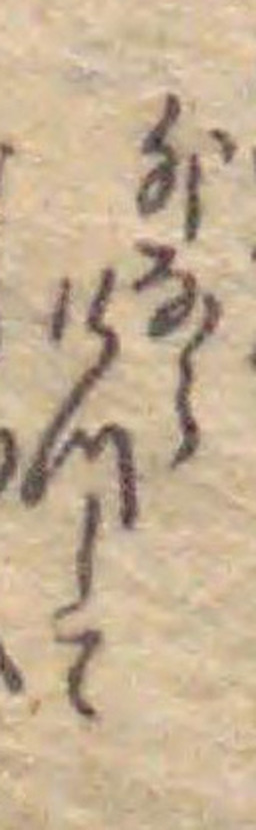けつして
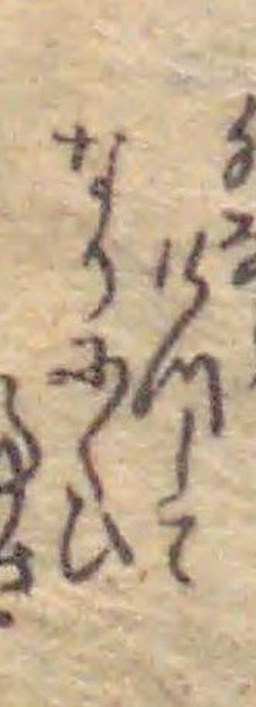なりにくひ
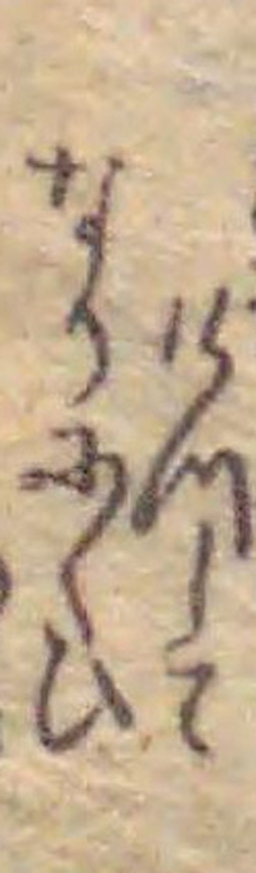なりにくひ

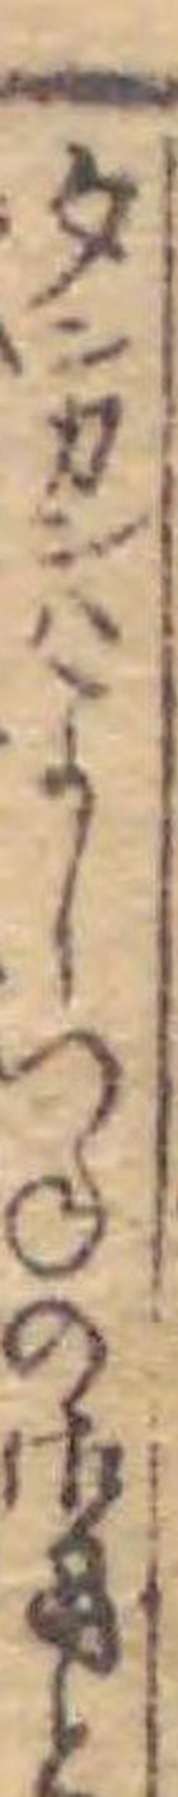タンカンはよしつねの御用と
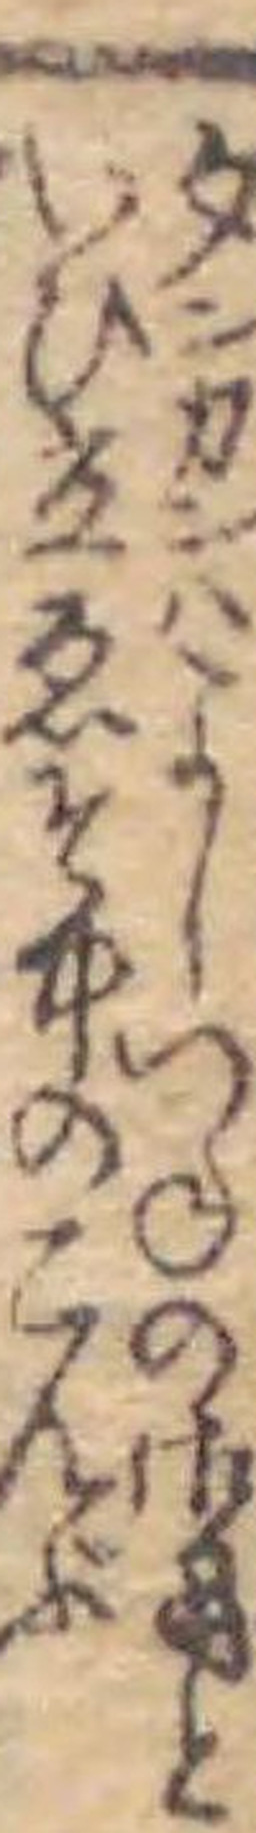いひ立ゑそ中のこんぶ
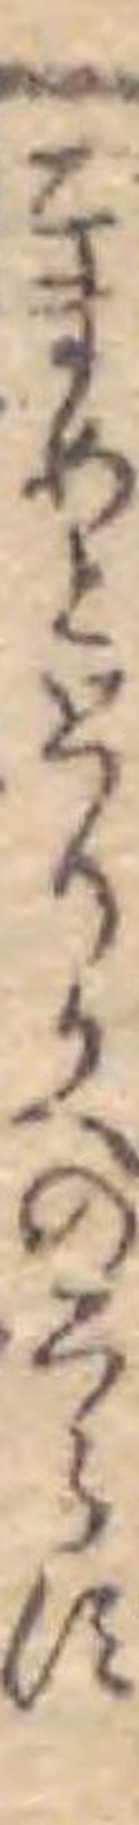こまめととりかへのこらす
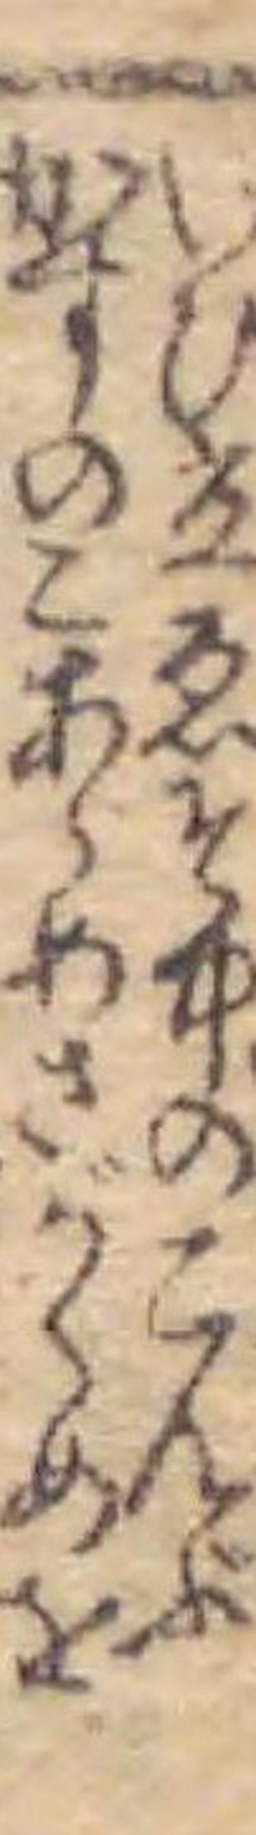かすのこあらめさがらめを
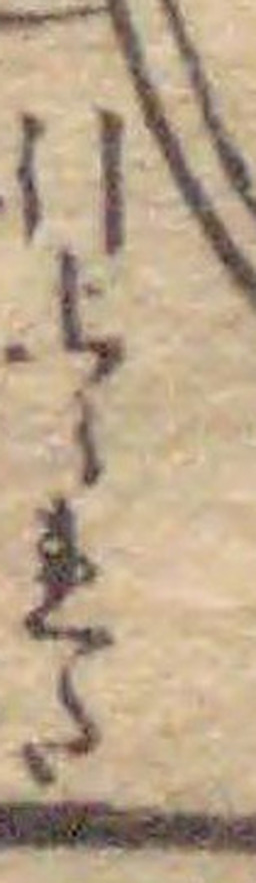引上られた
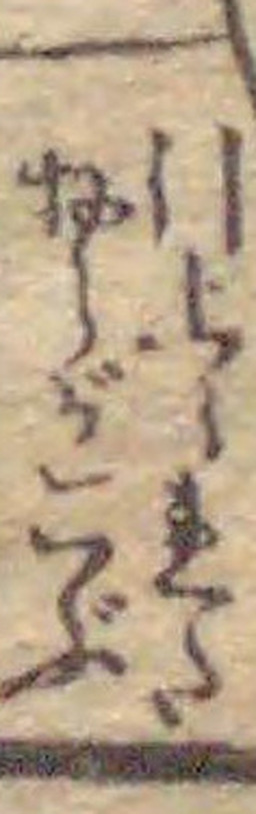おらがこぶ
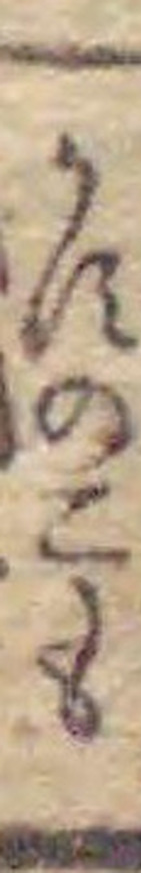かすのこも
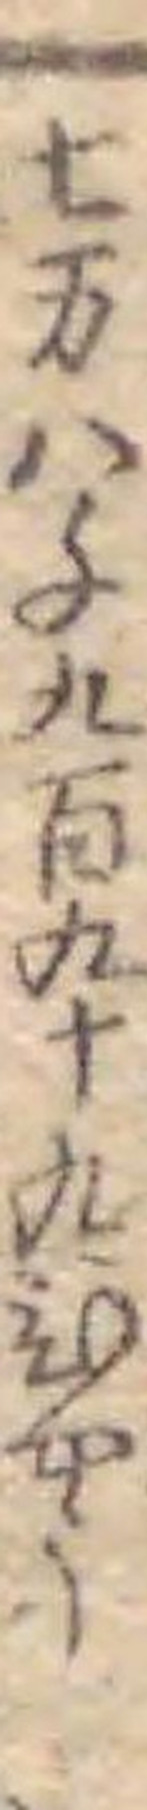七万八千九百九十九ひやう
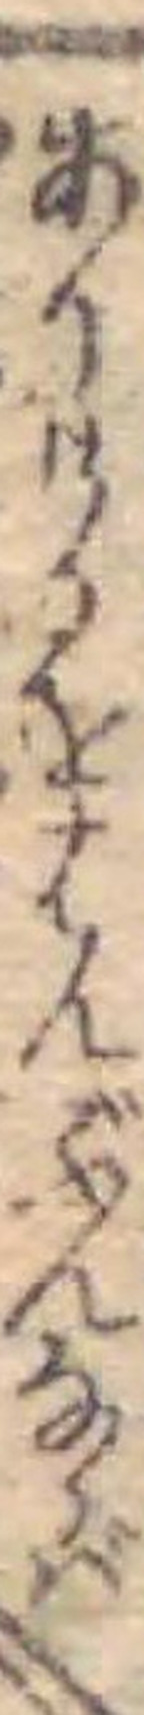ありけるをはんぶんならば
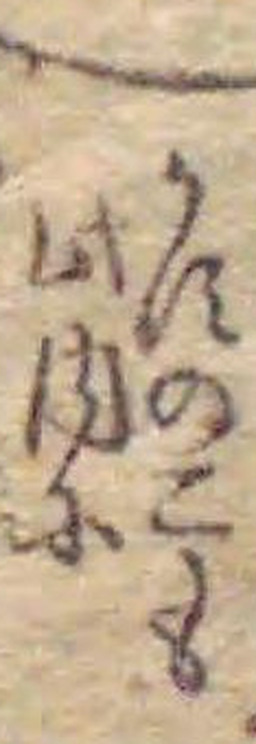此内に
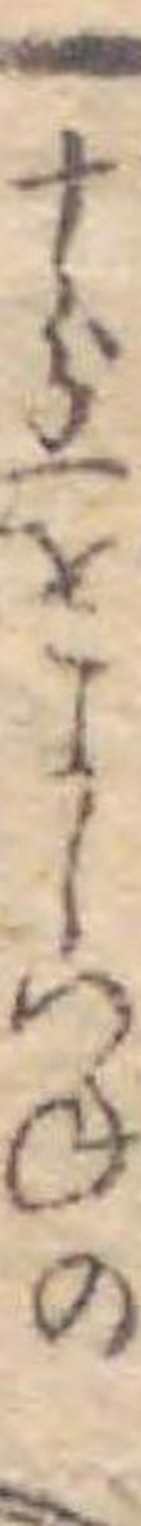十分一をよしつねの
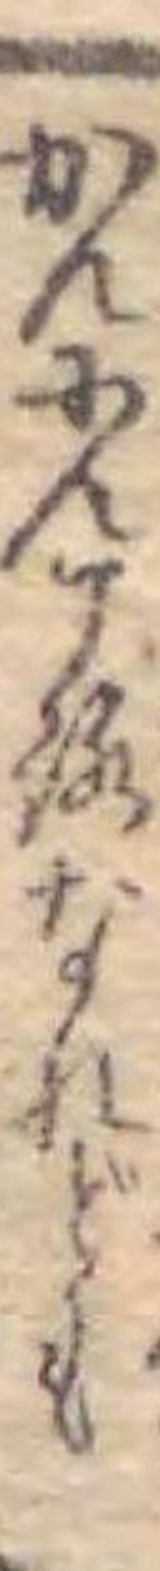かんにんころなれども
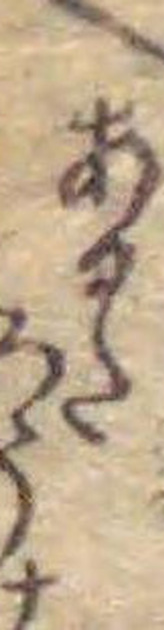あるた
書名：悦贔負蝦夷押領 : 3巻
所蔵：国立国会図書館 National Diet Library, JAPAN
